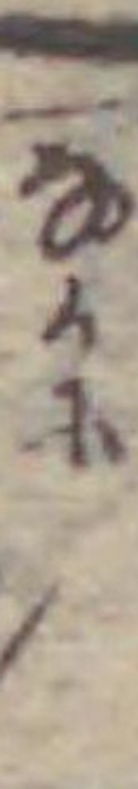〽なかに
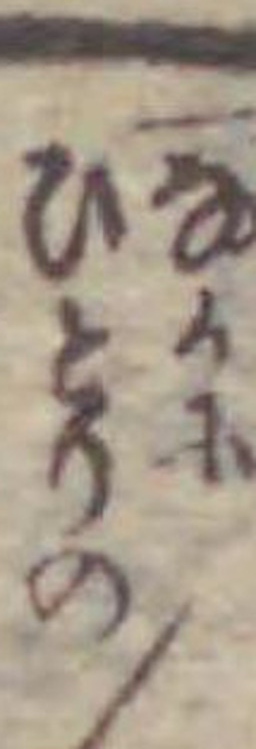ひとりの
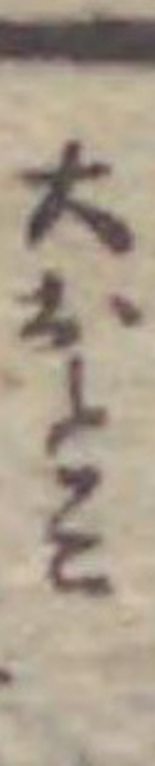大おとこ
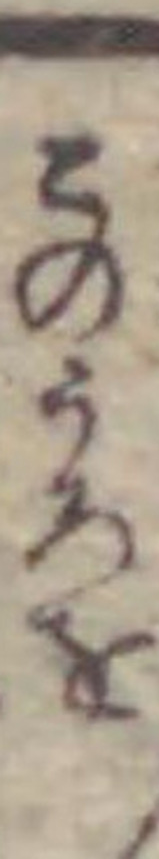このうろを
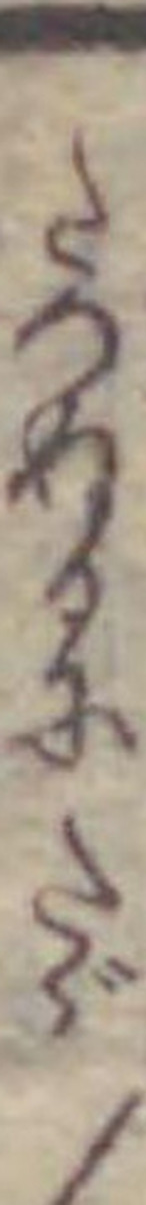たつぬるにたゞ
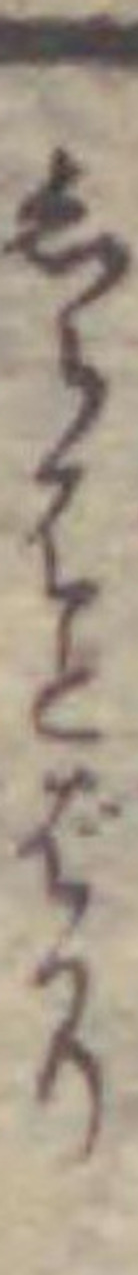しらはとばかり
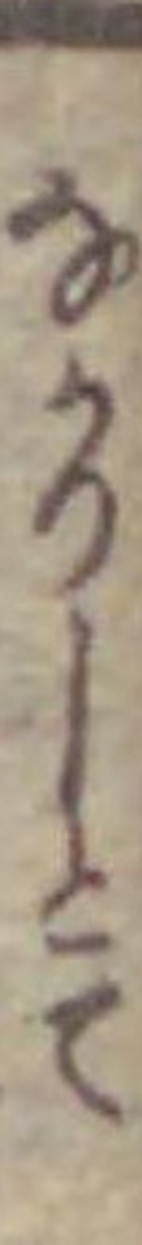なかりしとて
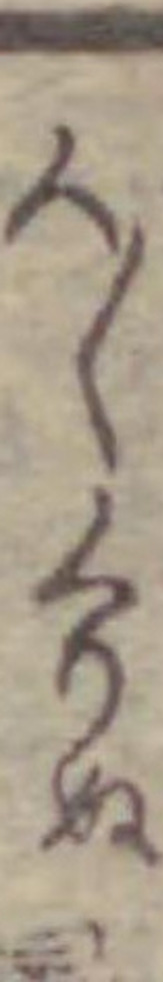人〳〵へりぬ
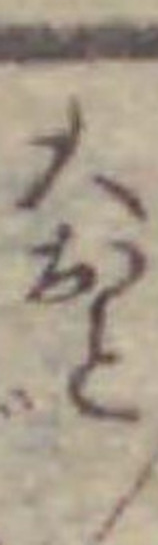大おと
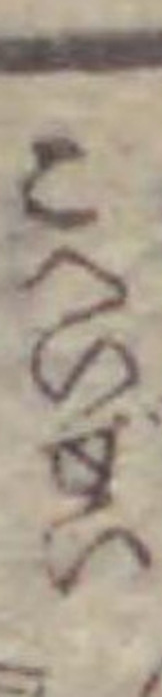こへいぜい
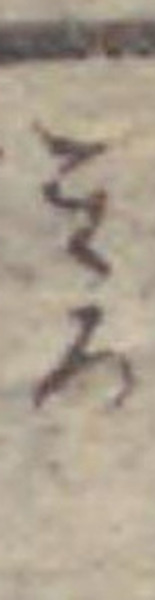こゝろ
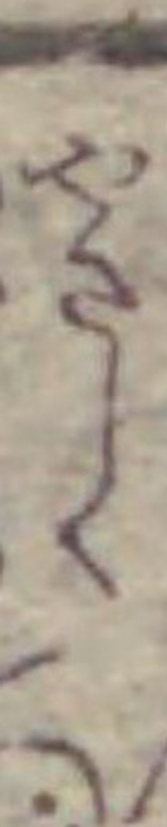やさしく
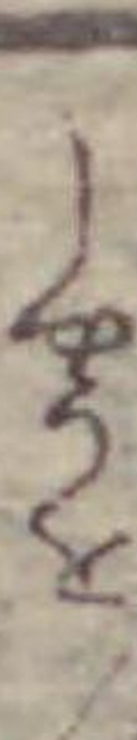しやうを
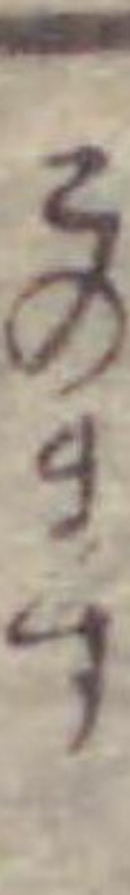このます
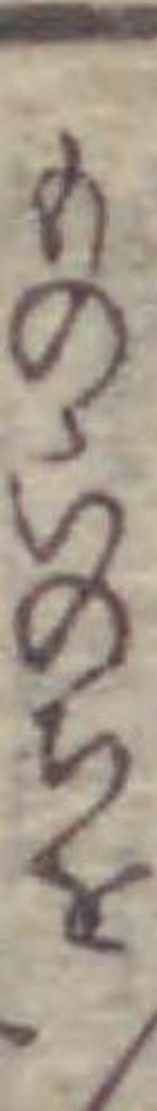ものゝいのちを
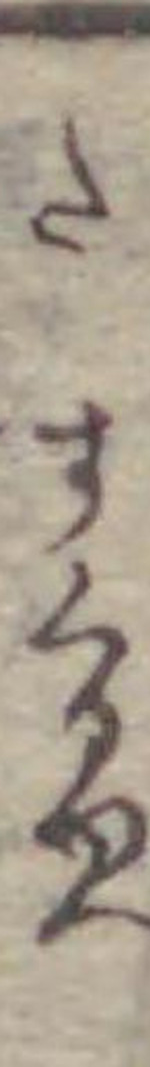たすくるゆへ
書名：武家物奇談 : 3巻
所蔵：国立国会図書館 National Diet Library, JAPAN
